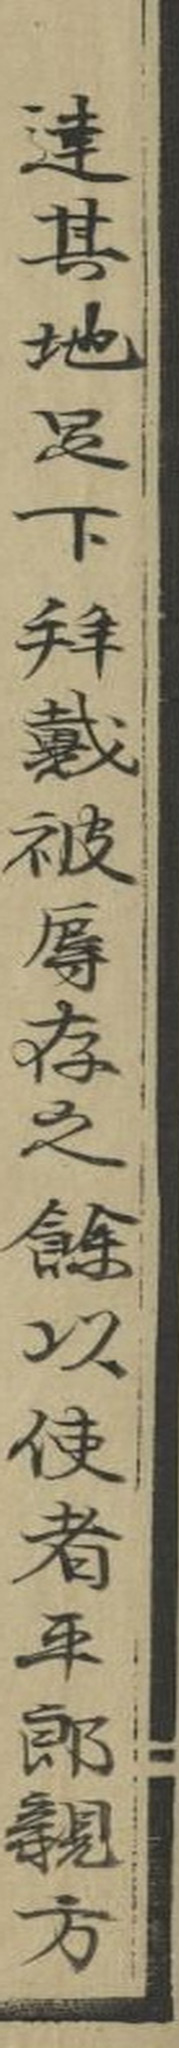達其地足下拝載被辱存之余以使者平郎親方
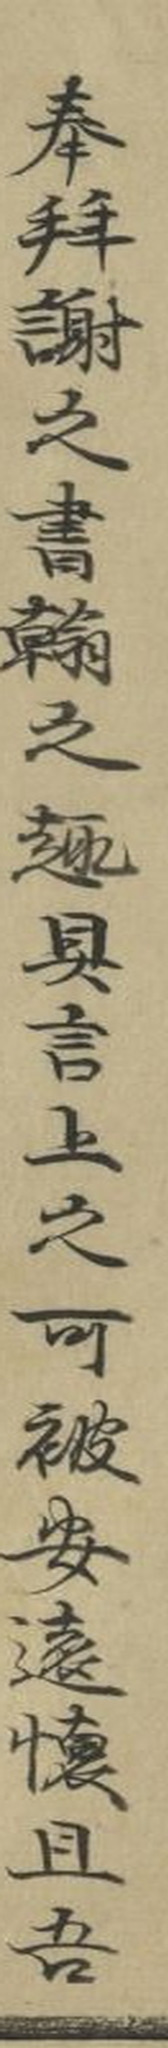奉拝謝之書翰之趣具言上之可被安遠懐且吾
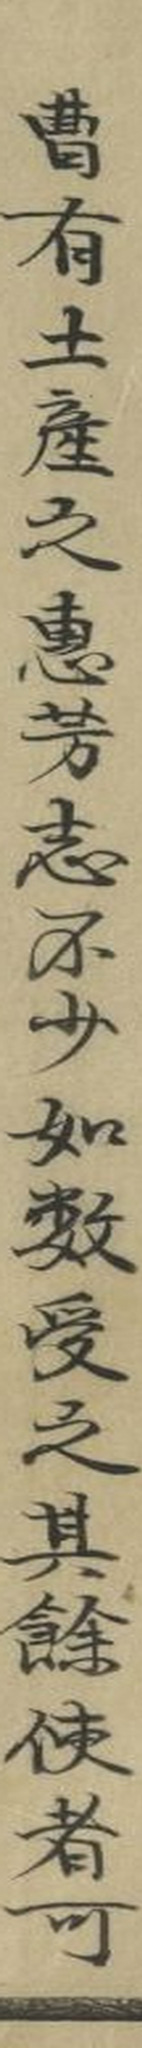曹有土産之恵芳志不少如数受之其余使者可
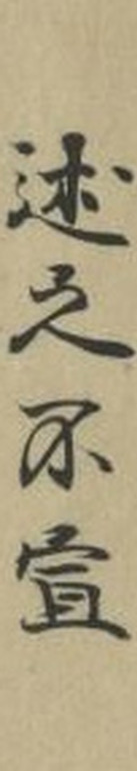述之不宣
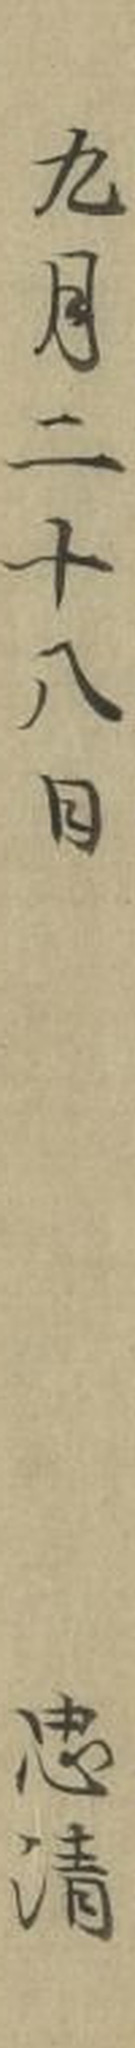九月二十八日忠清
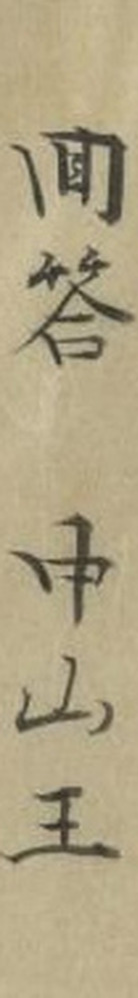回答中山王

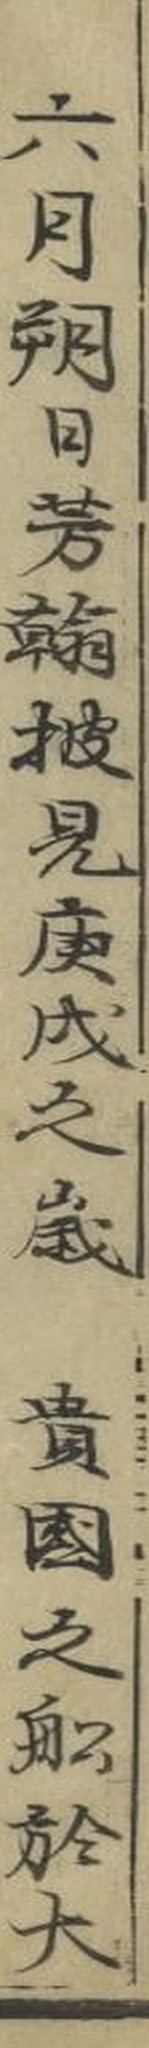六月朔日芳翰披見庚戌之歳貴国之舩於大
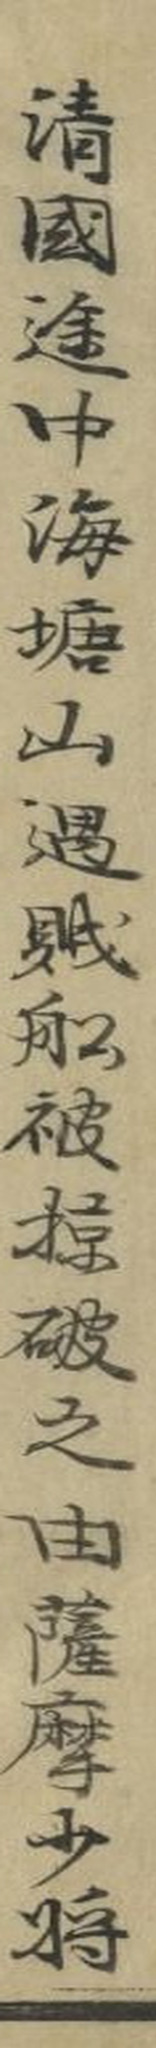清国途中海塘山遇賊舩被掠破之由薩摩少将
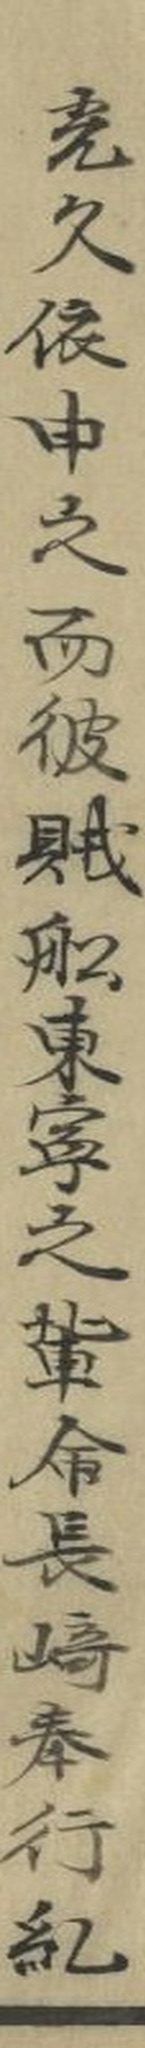光久依申之而彼賊舩東寧之輩命長崎奉行糺
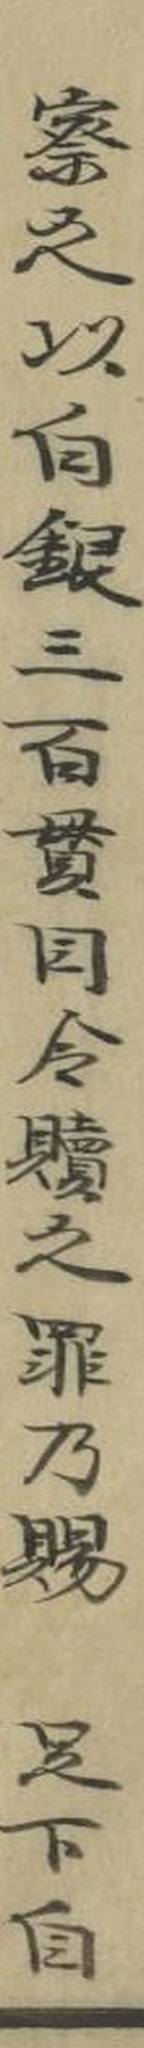察之以白銀三百貫目令贖之罪乃賜足下自
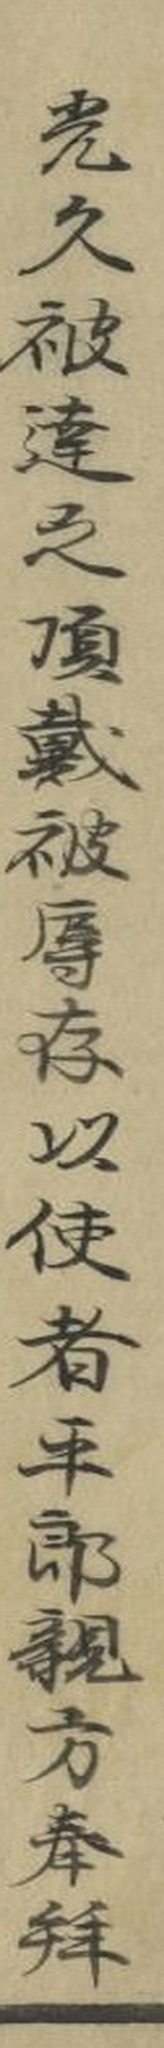光久被達之頂戴被辱存以使者平郎親方奉拝
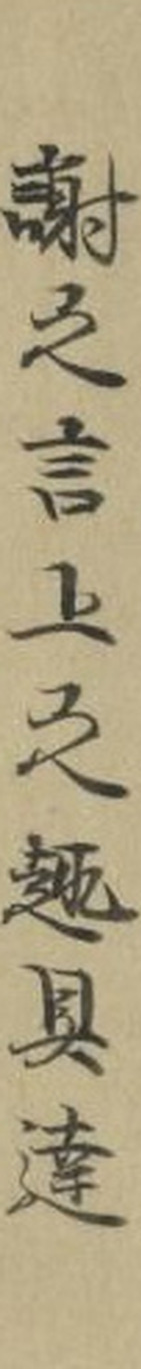謝之言上之趣具達
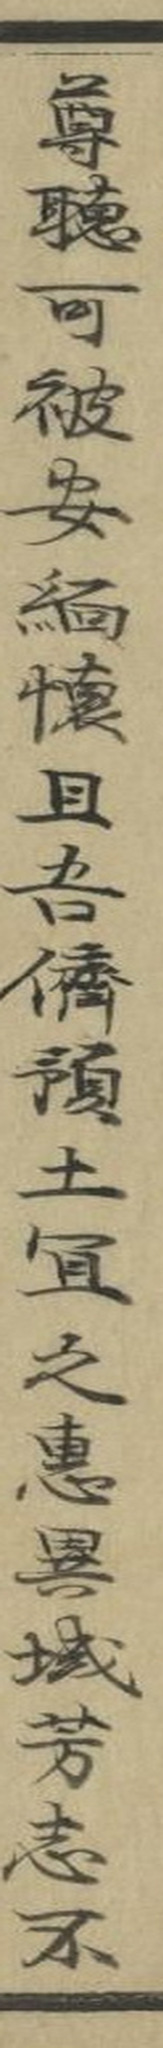尊聴可被安緬懐且吾済預土冝之恵異域芳志不
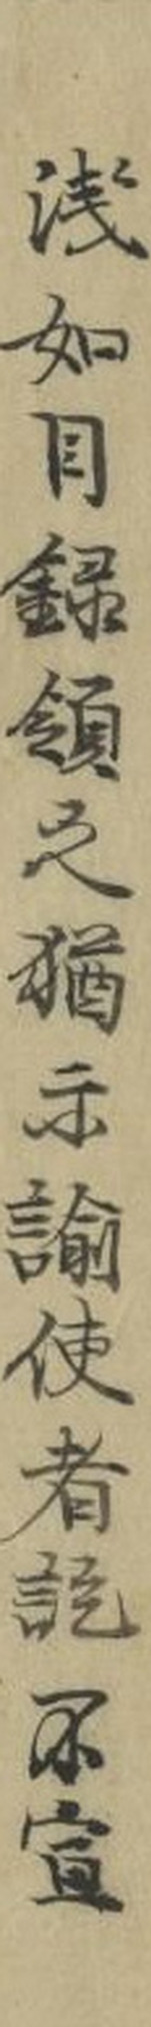浅如目録領之猶示諭使者訖不宣
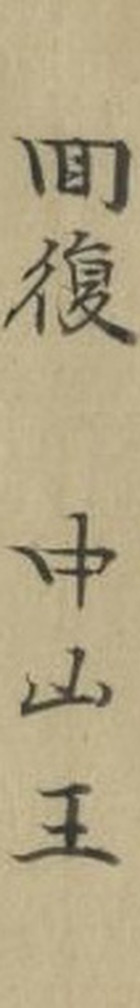回復中山王
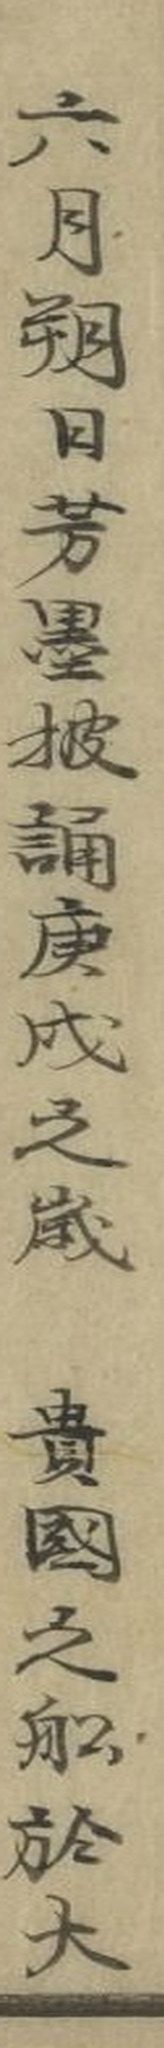六月朔日芳墨披誦庚戌之歳貴国之舩於大
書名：琉球往来（下）
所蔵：University of the Ryukyus Library
